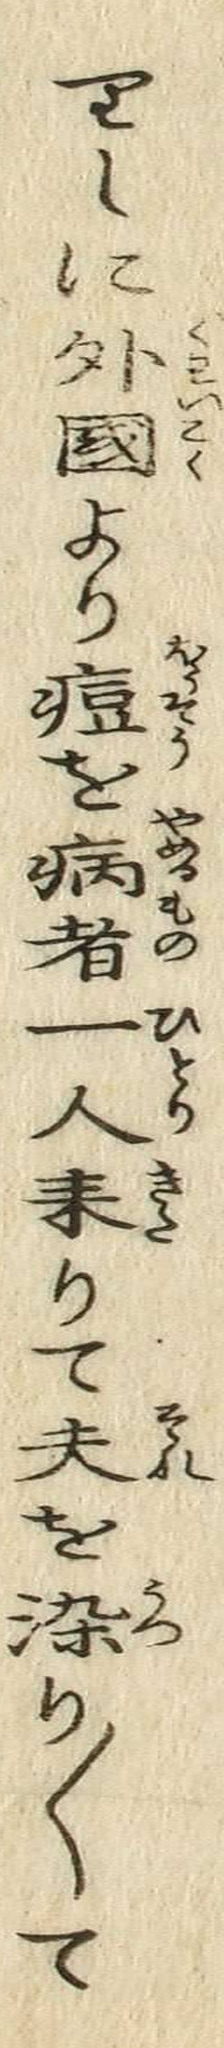りしに外國より痘を病者一人来りて夫を染り〳〵て
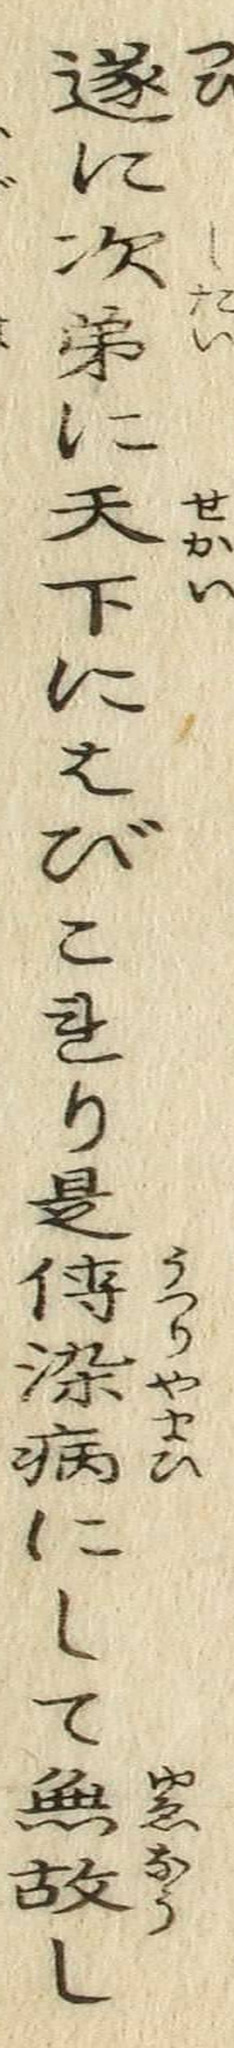遂に次第に天下にはびこれり是傅染病にして無故し
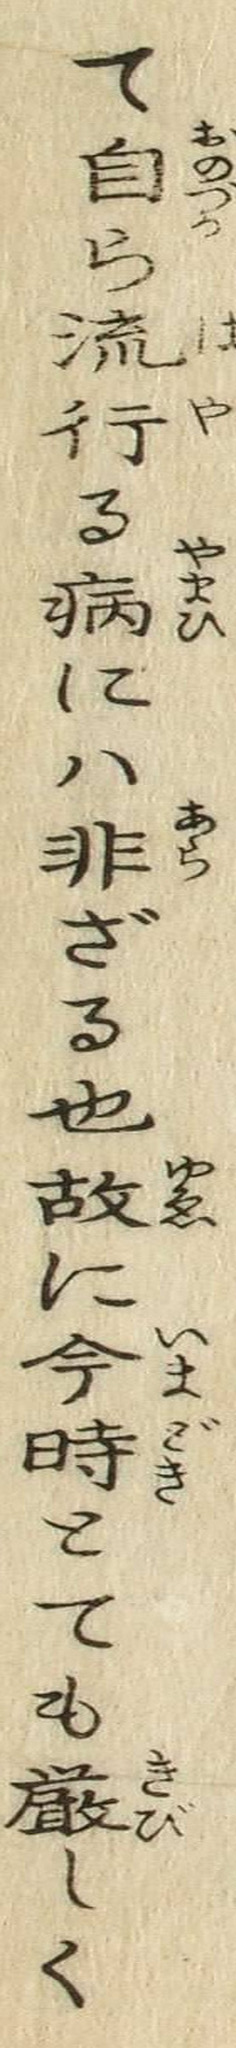て自ら流行る病には非ざる也故に今時とても厳しく

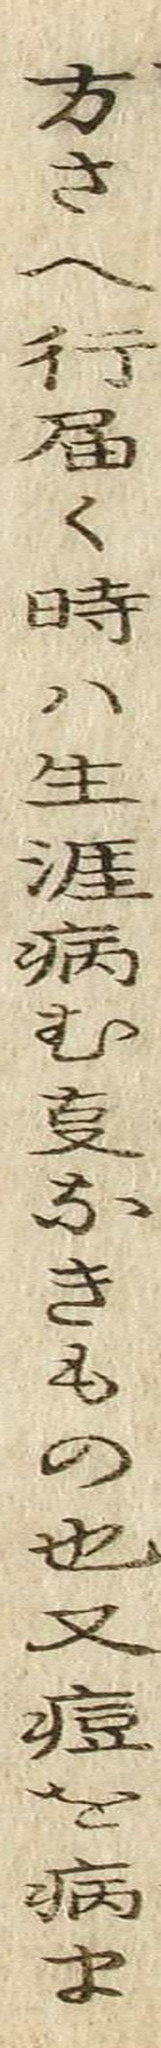方さへ行届く時は生涯病む㕝なきもの也又痘を病ま
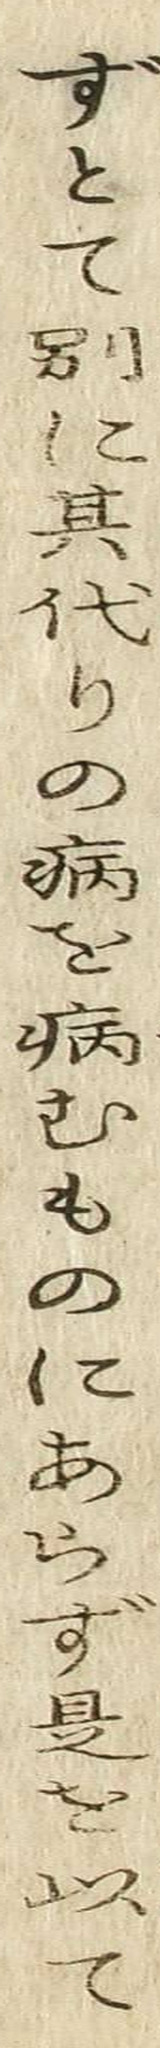ずとて別に其代りの病を病むものにあらず是以て
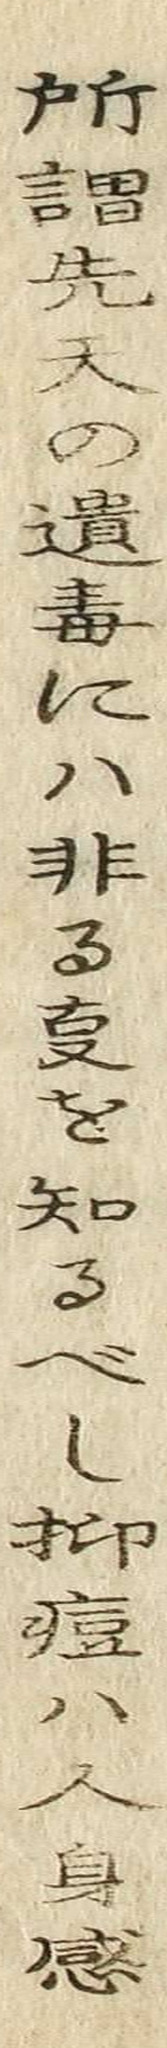所謂先天の遺毒には非る事を知るべし抑痘(は人身感
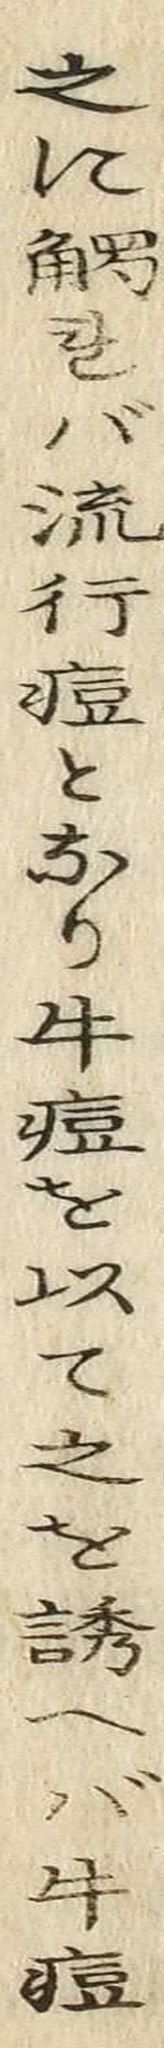之に触れば流行痘となり牛痘を以て之を誘へば牛痘
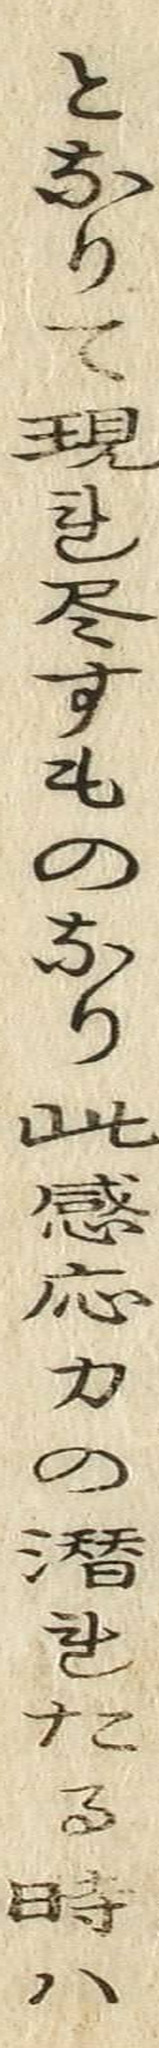となりて現れ尽すものなり此感応力の潜れたる時は
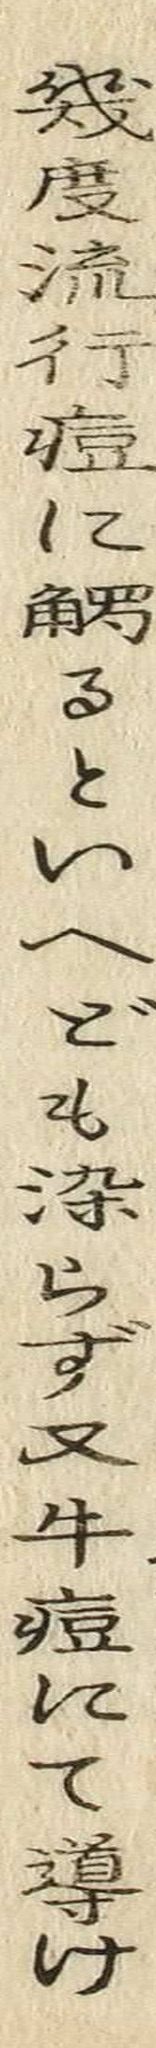幾度流行痘に触るといへども染らず又牛痘にて導け
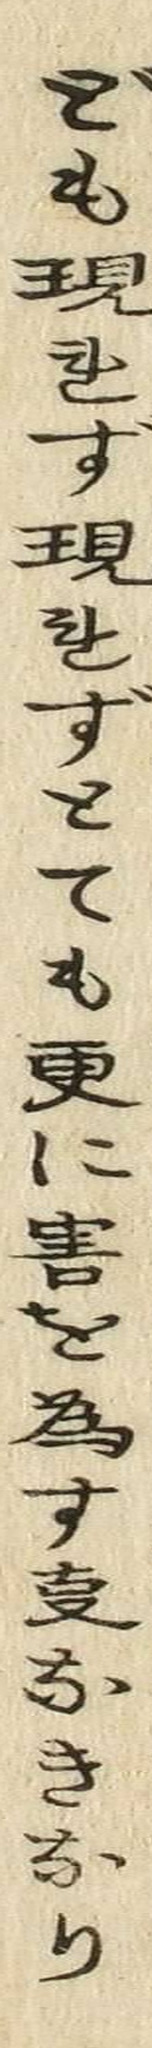ども現れず現れずとても更に害を為す㕝なきなり
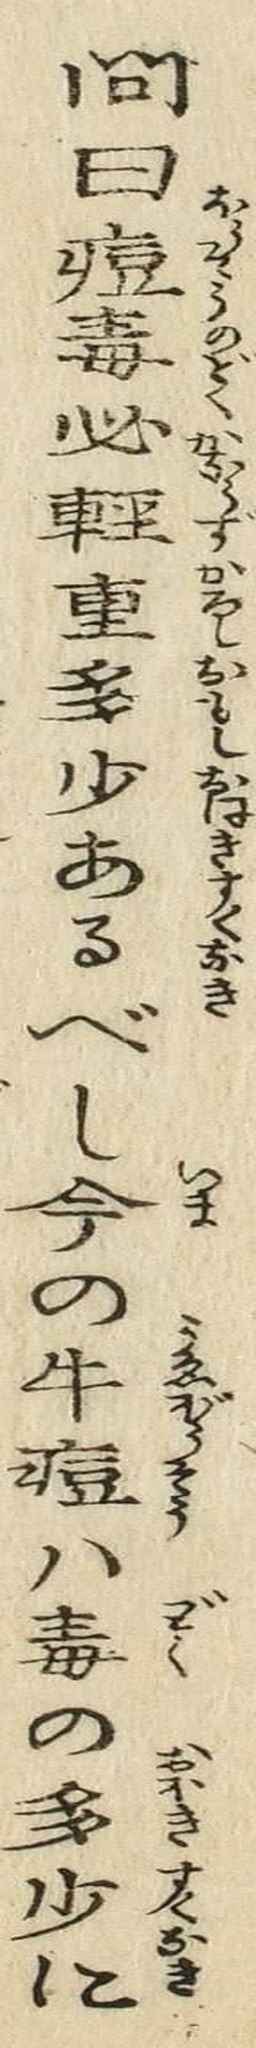問曰痘毒必軽重多少あるべし今の牛痘は毒の多少に
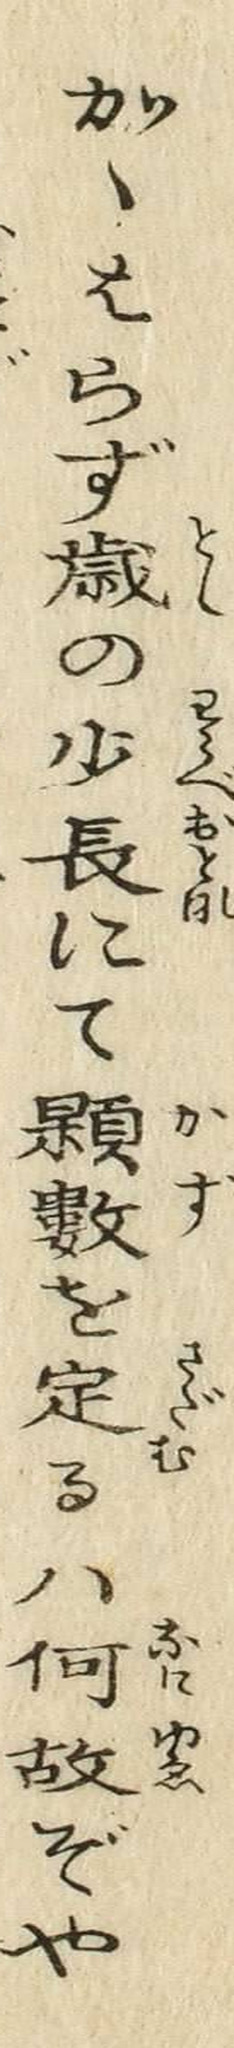かゝはらず歳の少長にて顆数を定るは何故ぞや
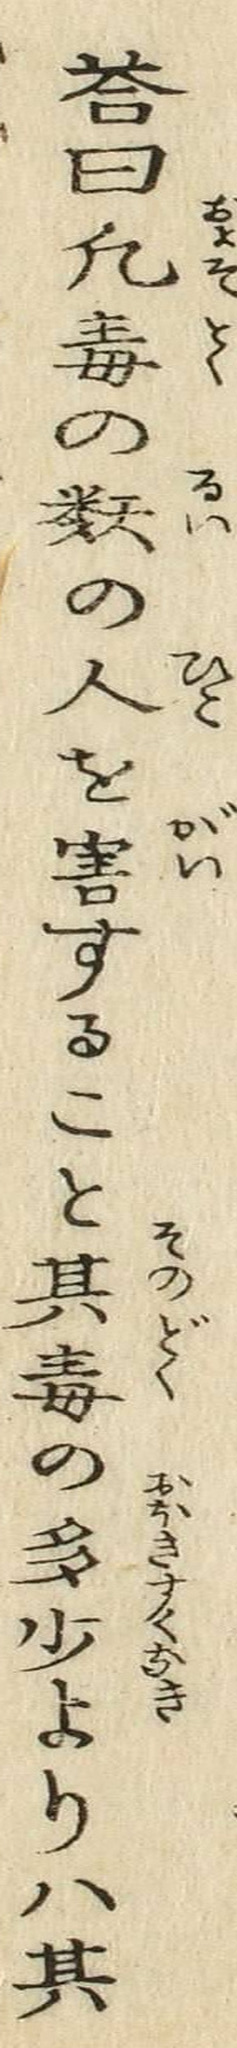答曰凡毒の類の人を害すること其毒の多少よりは其
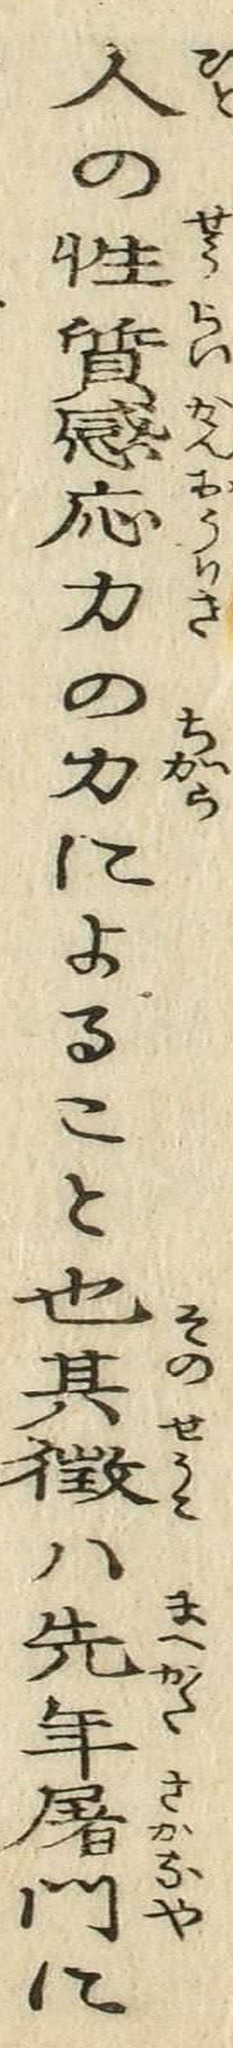人の性質感応力の力によること也其徴は先年屠門に
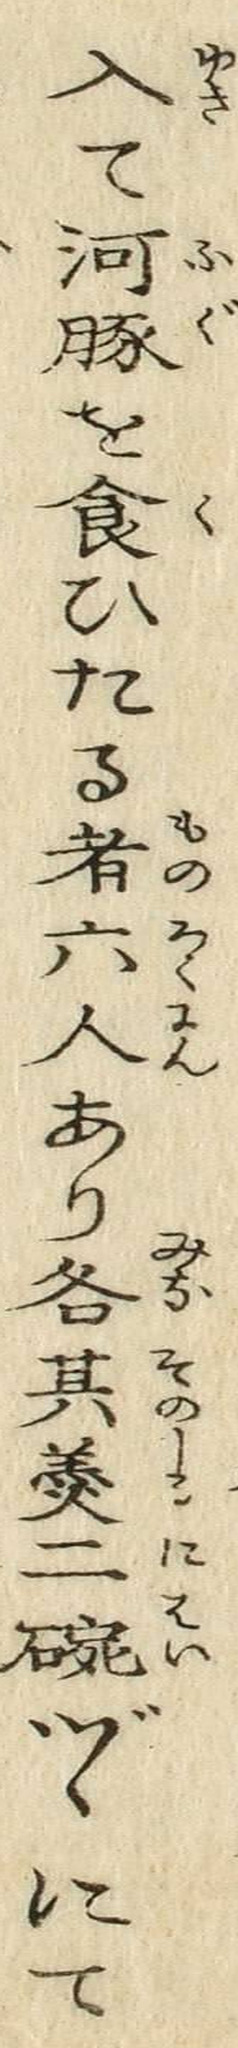入て河豚を食ひたる者六人あり各其羮二碗づゝにて
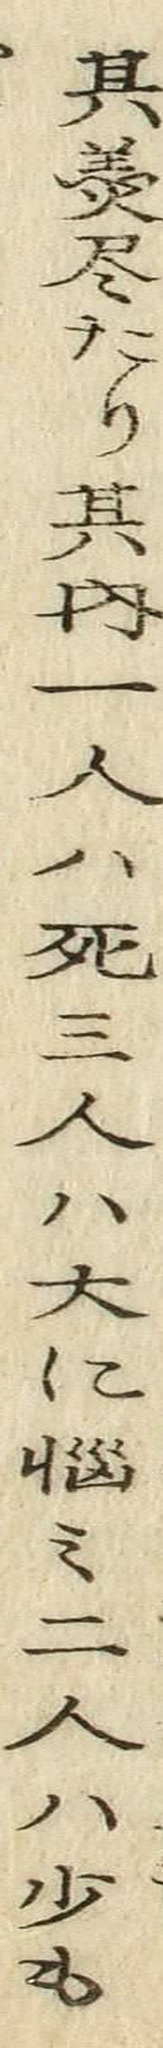其羮尽たり其内一人は死三人は大に悩み二人は少も
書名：牛痘問答
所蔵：九州大学医学図書館 国文学研究資料館
